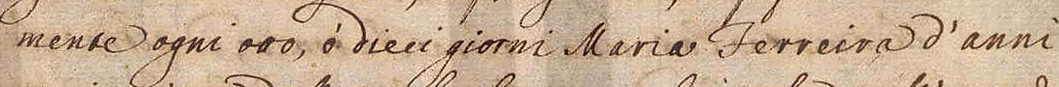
mente ogni otto, ó dieci giorni Maria Ferreira d'anni
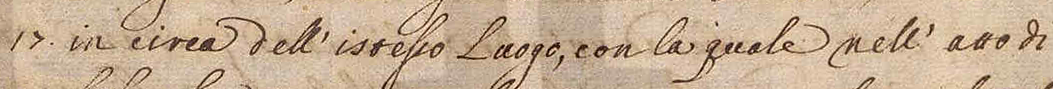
17. in circa dell'istesso Luogo, con la quale nell'atto di
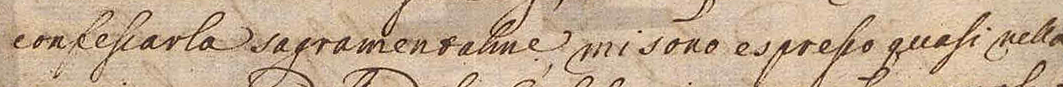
confessarla sagramentalme., mi sono espresso quasi nella
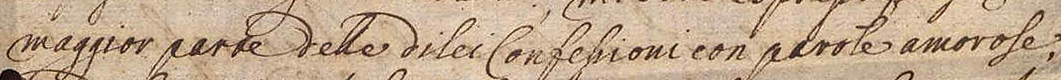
maggior parte delle di lei Confessioni con parole amorose,
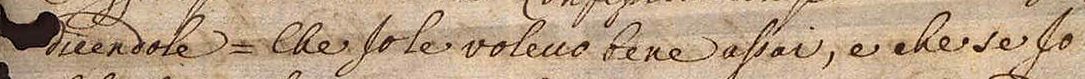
dicendole = Che Jole voleuo bene assai, e che se Jo
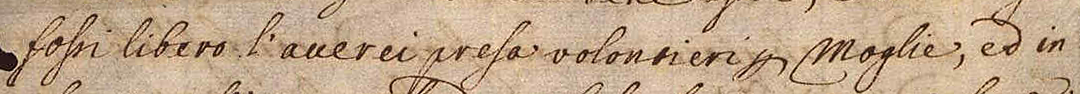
fossi libero l'auerei presa volontieri ꝑ moglie, ed in
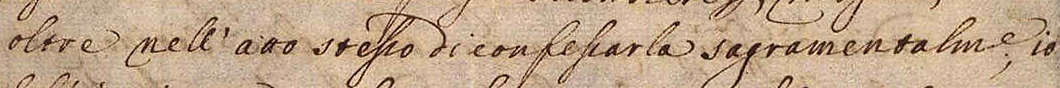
oltre nell'atto stesso di confessarla sagramentalm.e, io
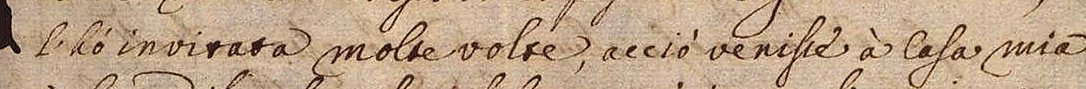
L'ho invitata molte volte, acció venissé à Casa mia
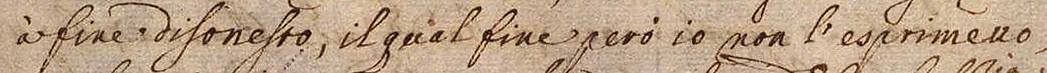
à fine disonesto, il qual fine peró io non l'esprimeuo,
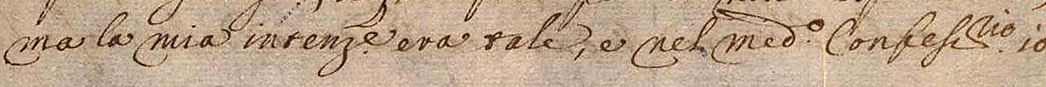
ma la mia intenz.e era tale, e nel med.o confes.rio io
